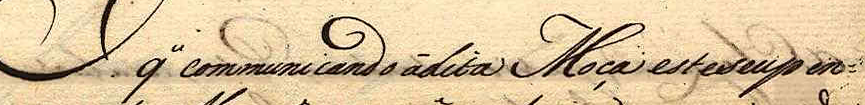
I q̄ communicando á dita Moça este seu pen
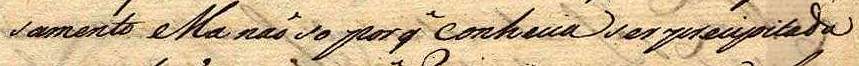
samento ella naõ so porq̄ conhecia ser precepitada
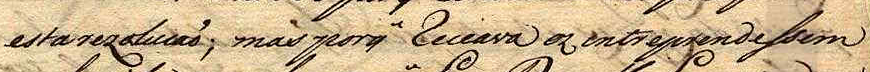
esta rezoluçaõ; mas porq̄ Receava oz entreprendessem
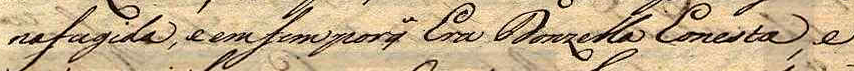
na fugida, e emfim porq̄ Era Donzella honesta, e
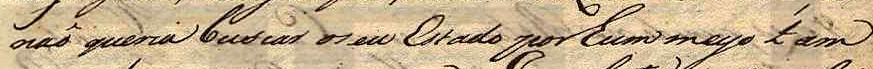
naõ queria buscar o seu Estado por hum meyo tam
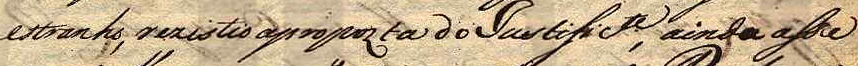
estranho, rezistio a propozta do Iustificte, ainda asse
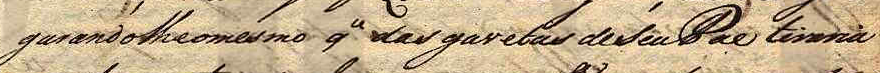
gurandolhe o mesmo q̄ das gavetas de seu Pae tiraria
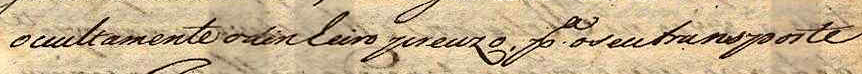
ocultamente o dinheiro precizo, p.a o seu transporte
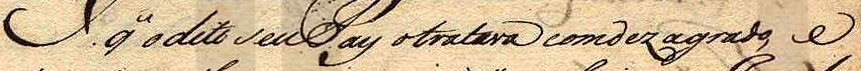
I q̄ o dito seu Pay o tratava com dezagrado, e
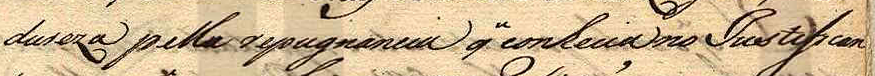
dureza pella repugnancia q̄ conhecia no Iustifican
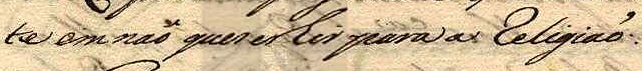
te em naõ querer hir para a Religiaõ.
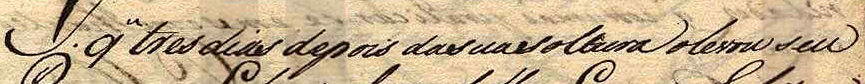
I q̄ tres dias depois da sua soltura o levou seu
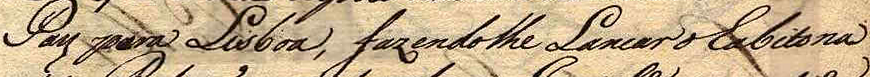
Pay para Lisboa, fazendolhe Lancar o habito na
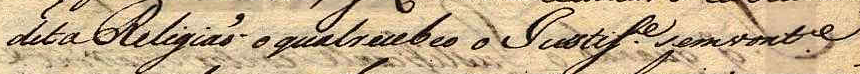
dita Religiaõ o qual recebeo o Iustif.e sem vont.e
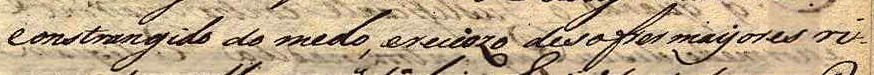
constrangido do medo, e reciozo de sofrer mayores ri
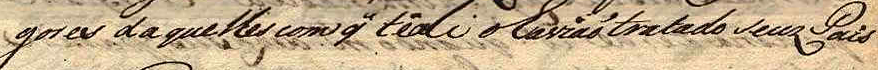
gores daquelles com q̄ té ali o haviaõ tratado seuz Pais
